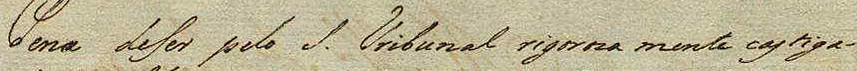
Pena de ser pelo S. Tribunal rigorozamente castiga
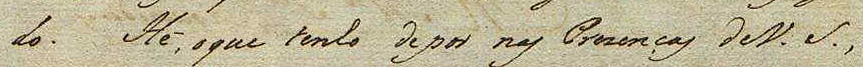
do. Hé, o que tenho de por nas Prezenças de V. S.,
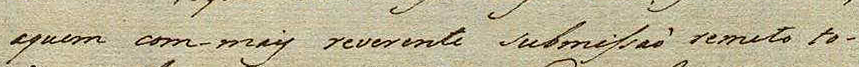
a quem com mais reverente submissaõ remeto to
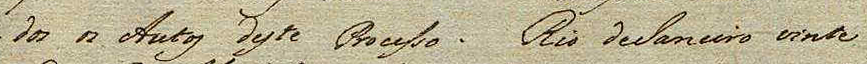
dos os Autos deste Processo. Rio de Janeiro vinte
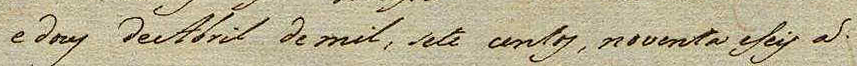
e dous de Abril de mil, setecentos, noventa e seis a.
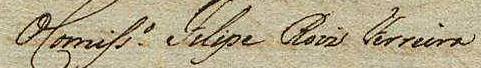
O Comiss.o Felipe Rois Ferreira
